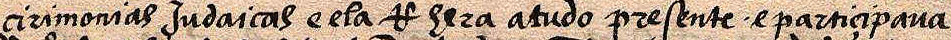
çirimonias Judaicas e ela R hera a tudo presente. e partiçipaua
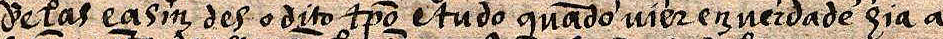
delas e asim des o dito tp̄o e tudo quādo uier em uerdade hia a
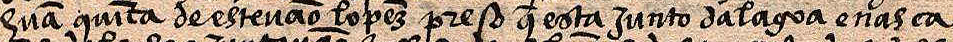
huā quīta de esteuão lopez̄ preso q̄ esta Junto da lagoa e nas ca
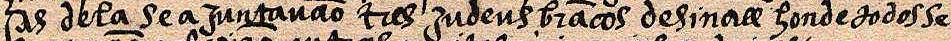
sas dela se aJuntauão tres Judeus brācos de sinall honde todos se
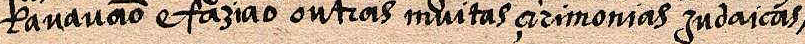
lauauão e fazião outras muitas çirimonias Judaicas/
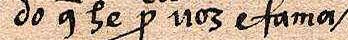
do q̄ he ꝓca uoz e fama/
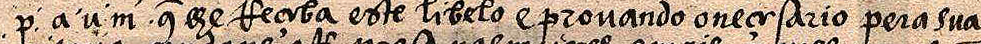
p: a u m .q̄ lhe Reçeba este libelo e prouando o neçesario pera sua
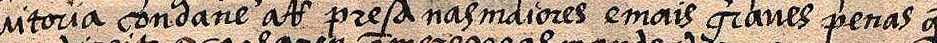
uitoria condane a R presa nas maiores e mais graues penas q̄
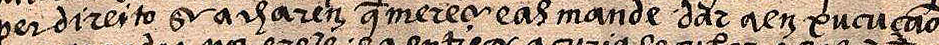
per direito se acharem q̄ mereçe e as mande dar a emxucução
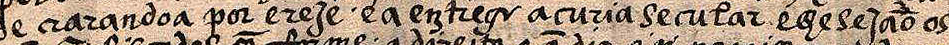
de crarandoa por ereJe. e a emtrege a curia secular e lhe seJão os
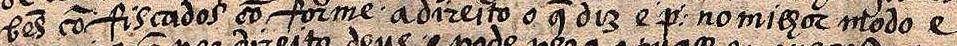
bēs cōfiscados cōforme . a direito o q̄ diz e p: no milhor modo e
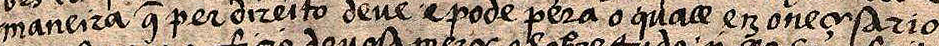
maneira q̄ per direito deue e pode pera o quall em o neçesario
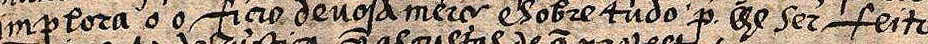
implora o ofiçio de uosa merçe e sobretudo p: lhe ser feito
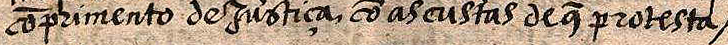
cōprimento de Justiça cō as custas de q̄ protesta/
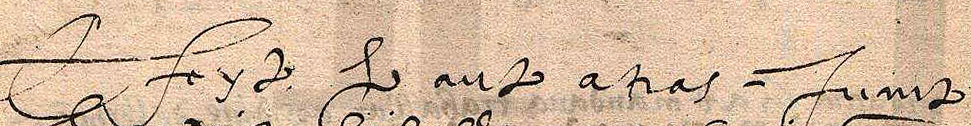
E feyto ho auto atras e Jumto
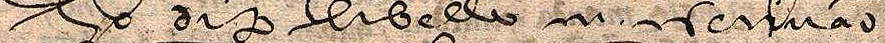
ho dito libello eu. escriuão
